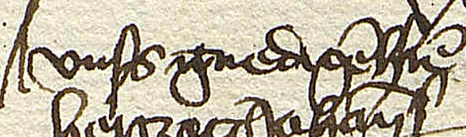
vnſ*s gnedige* h*re*
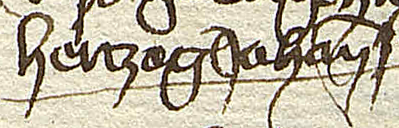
hercʒog Iohan*
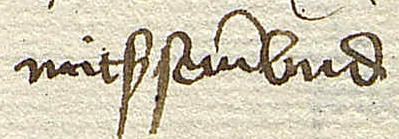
mitſ* ſein* vnd
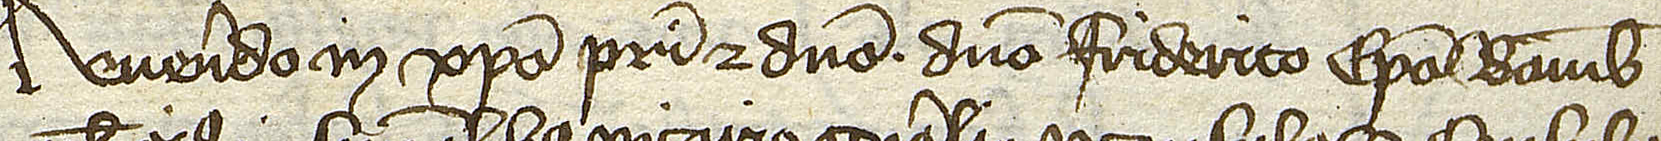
Reue*ndo in xpo* p*ri @ d*no . d*no Friderico Ep*o Bamb*
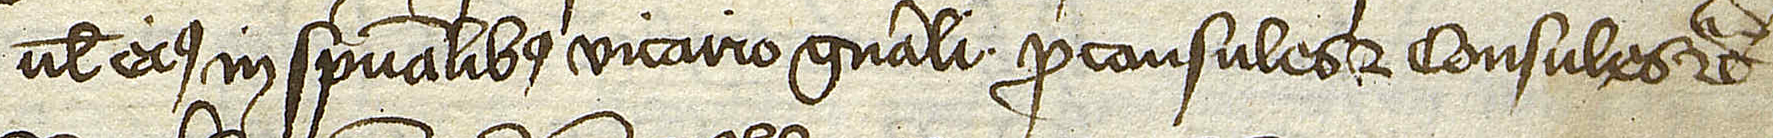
u*l ei* in ſp*ualib* vicario g*n*ali . p*conſules @ Conſules ec*
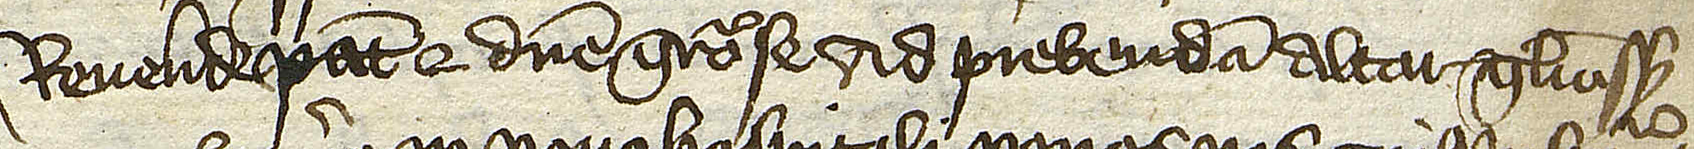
Reue*nde pat* @ d*ne g*roſe Ad prebenda* Altar* gl*ioſſ*
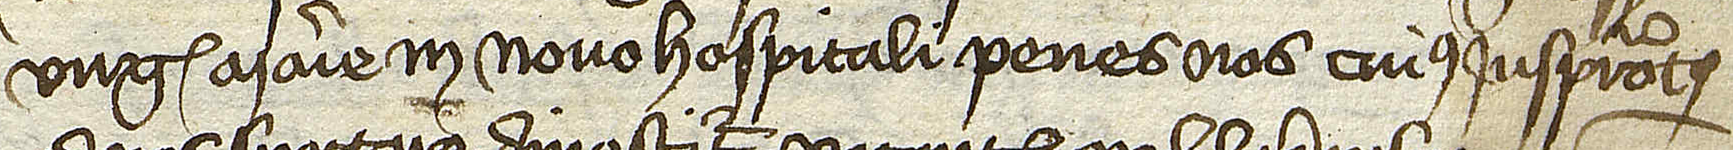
virg* Ma*ie in Nouo hoſpitali penes nos cui* Ius p*ro*t*
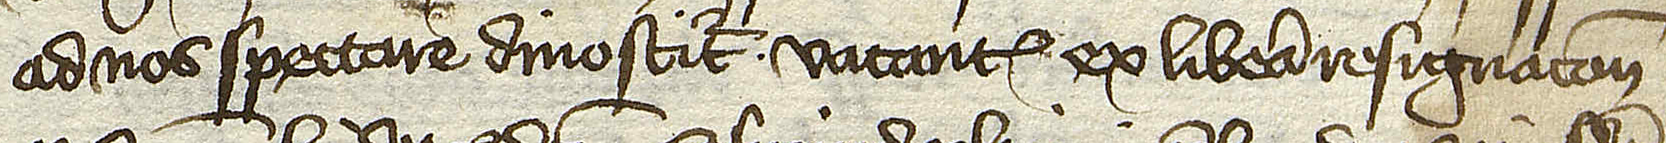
ad nos ſpectare dinoſcit* vacant* ex libe*a reſignac*on*
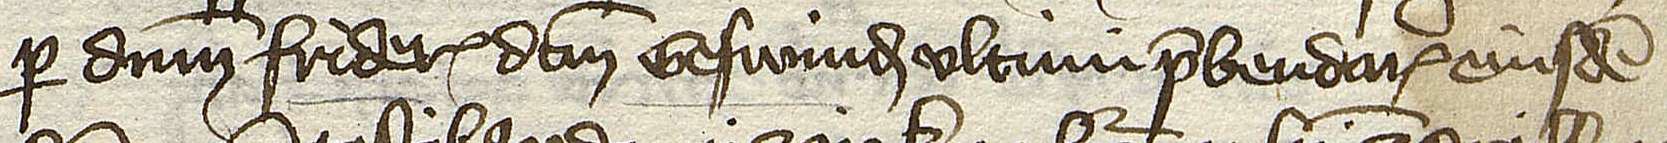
p* d*n*m Frider* d*c*m Geſwind* vltimi p*bendar* eiuſde*
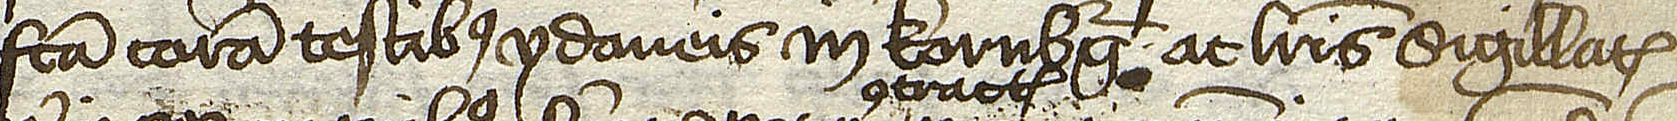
ſ*c*a cora* teſtib* ydoneis in Kornb*g ac l*ris Sigillat*
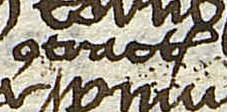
*tract*
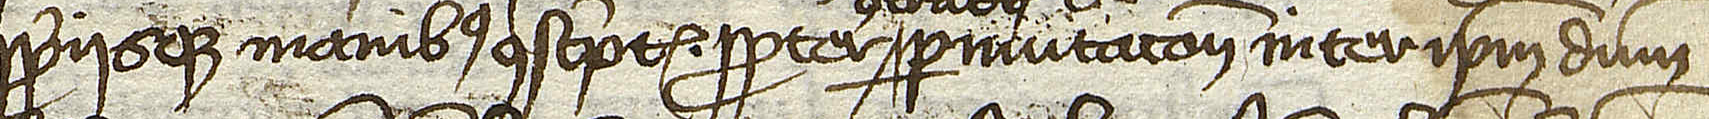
p*p*iisq* manib* *ſc*pt* p*pter p*mutac*on* inter ip*um d*um
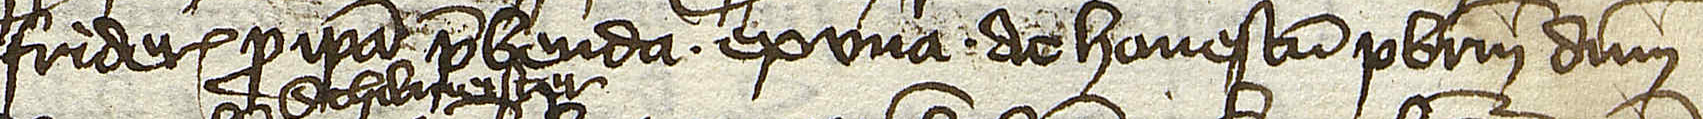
Frider* p* ip*a p*benda . ex vna . Ac honeſtu* p*b*r*m d*um
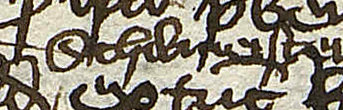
Schulmeiſter
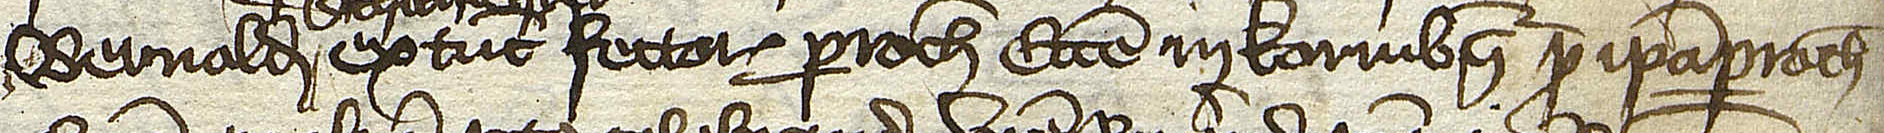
Bernold* ex tu*c fector* p*roch* Ecc*e in Kornb*g p* ip*a p*roch*
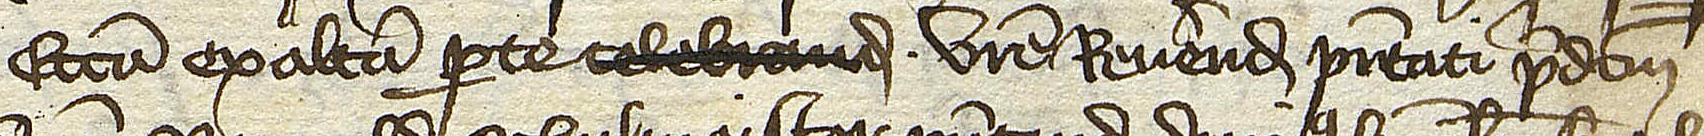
Ecc*a* ex alt*a p*te celebrand* . v*re Reue*nd* p*ntati p*d*c*m
